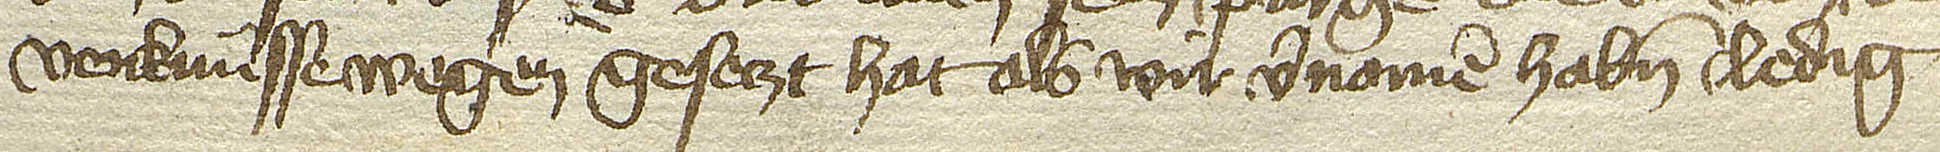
venknüſſe wegen geſecʒt hat als wir v*nome* habn* / ledig
